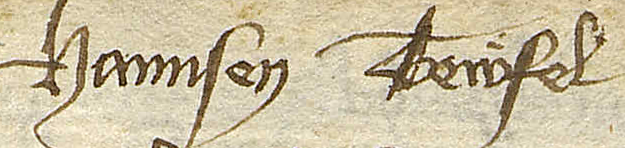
Hannſen Teẅfel
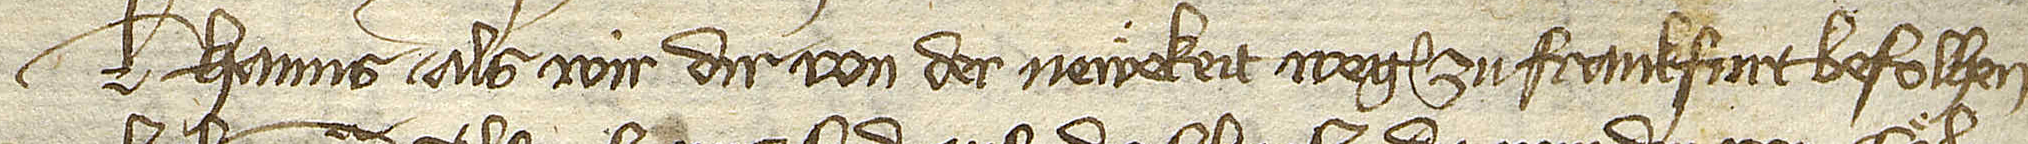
L* Hanns / als wir dir von der neẅekeit weg* ʒu frankfurt befolhen
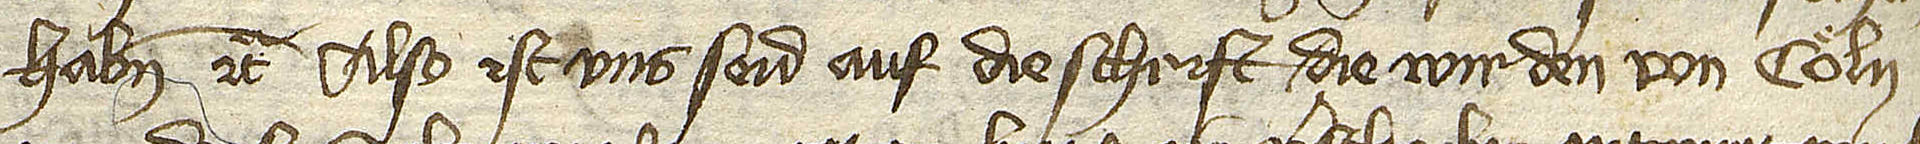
habn* ec* Alſo iſt vns ſeid auf die ſchrift / die wir den von Cöln
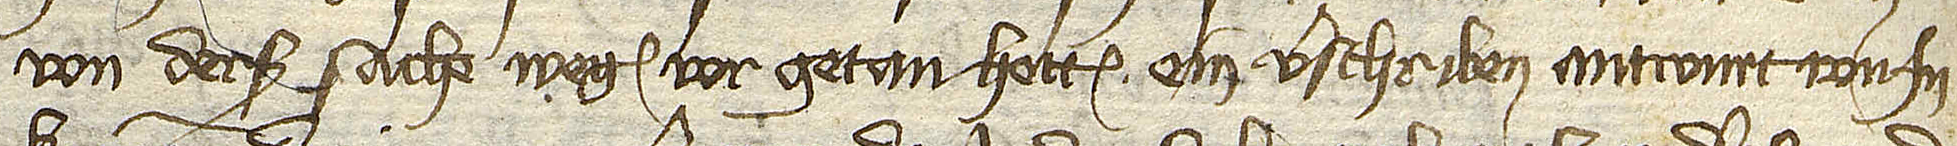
von derſ* ſache weg* vor getan hett* ein v*ſchriben antwurt von In
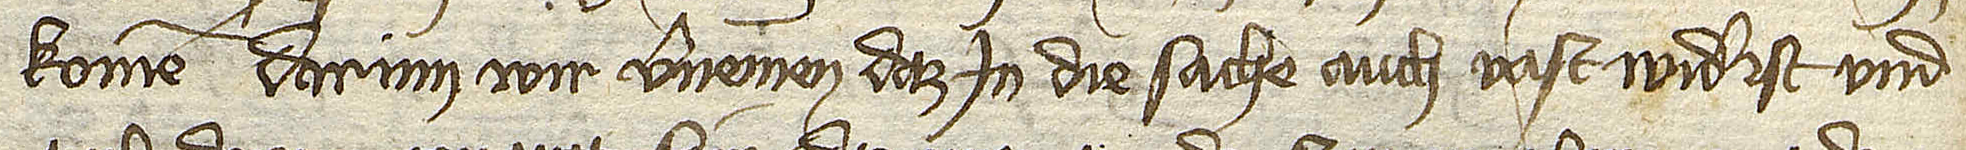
kome* Darinn wir v*nemen daʒ In die ſache auch vaſt wid*iſt vnd
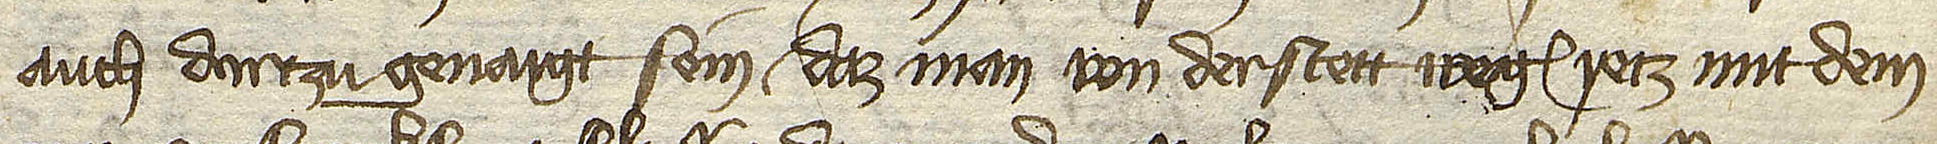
auch darcʒu genaigt ſein / daʒ man von der ſtett weg* yecʒ mit dem
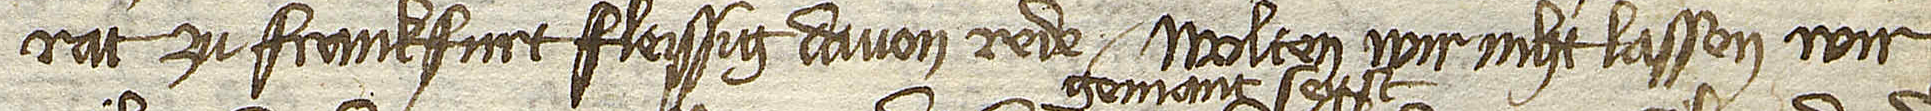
rat ʒu frankfurt fleiſſig dauon rede / wolten wir niht laſſen wir
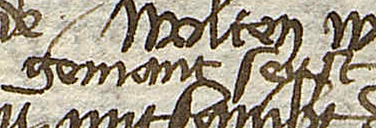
gemant ſeyſt
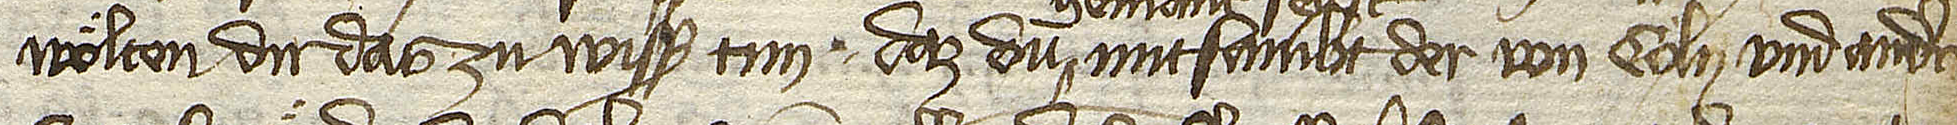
wölten dir das ʒu wiſſ* tun / daʒ du mitſambt der von Cöln vnd and*r
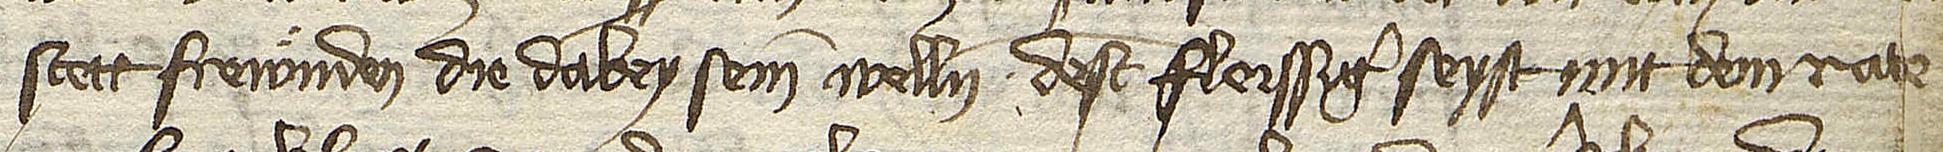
ſtett freẅnden die dabey ſein welln* . deſt fleiſſig* ſeyſt mit den rate
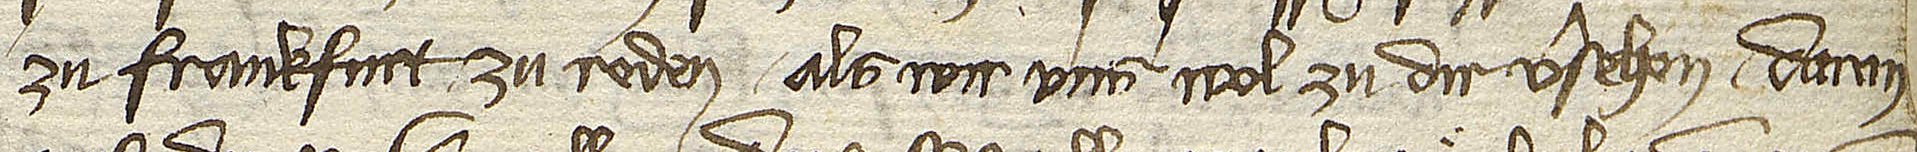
ʒu frankfurt ʒu reden / als wir vns wol ʒu dir v*ſehen / Daran
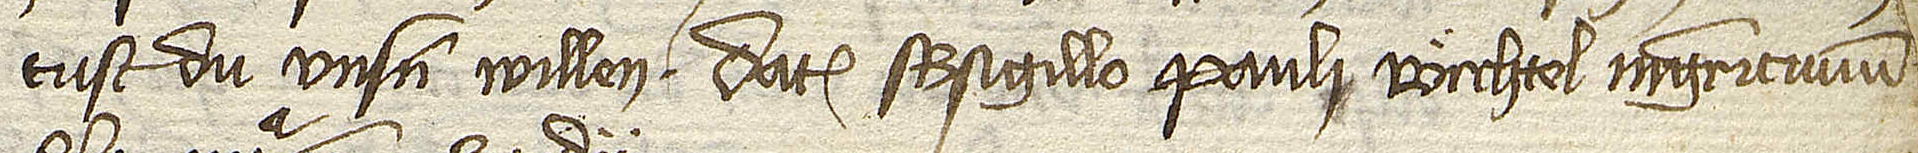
tuſt du vnſn* willen . Dat* ſ*ſigillo Pauli Vörchtel m*griciuiu*
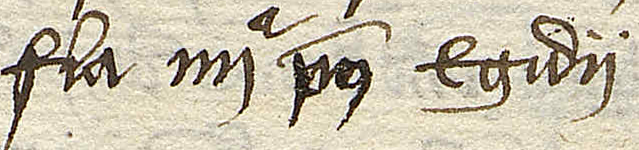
fi*a iiii* p* Egidii
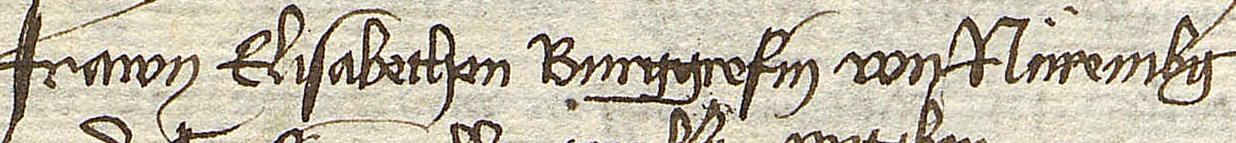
Frawn Eliſabethen Burggrefin von Nüremb*g
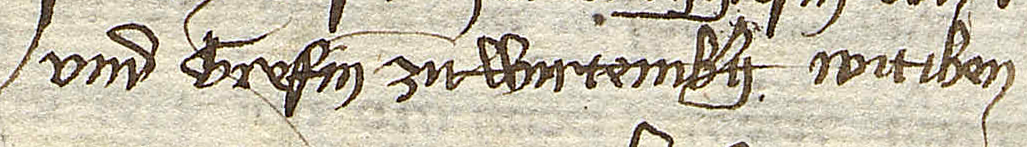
vnd Grefin* ʒu wirtemb*g witiben
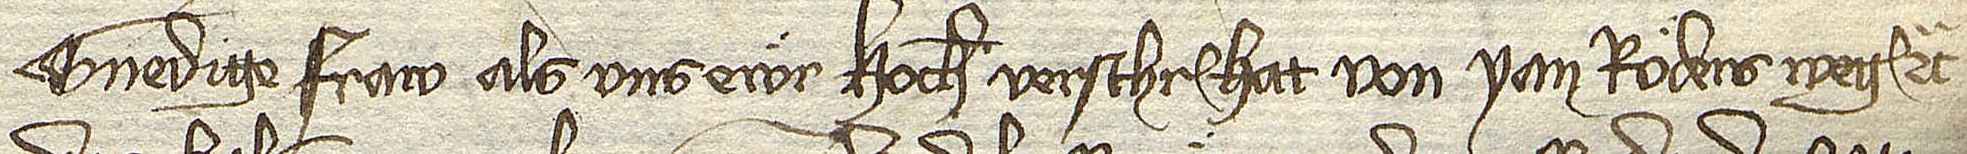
Gnedige Fraw als vns eẅr Hoch* verſchr* hat von Yan Röders weg* ec*
